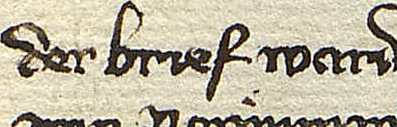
der brief ward
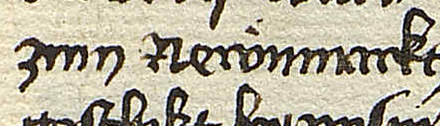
ʒum Newnmarkt
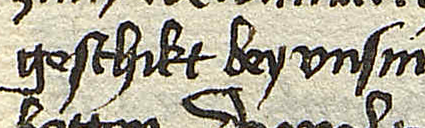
geſchikt bey vnſm*
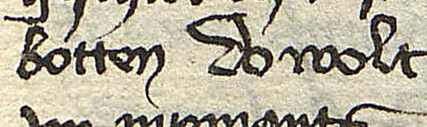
botten Do wolt
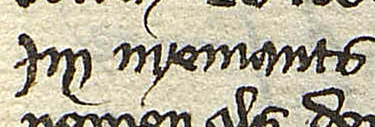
Im nyemants
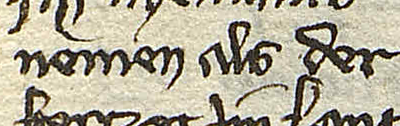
nemen als der
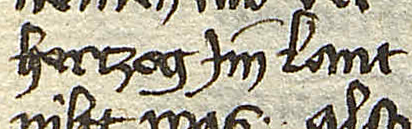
hercʒog Im* lant
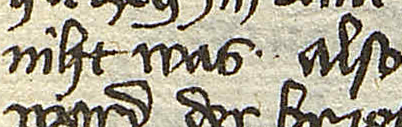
niht was . alſo
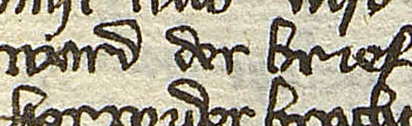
ward der brief
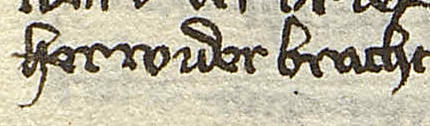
herwider bracht
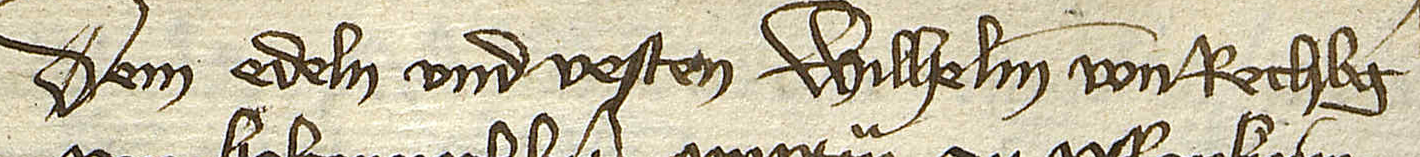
Dem edeln vnd veſten Wilhelm* von Rechb*g
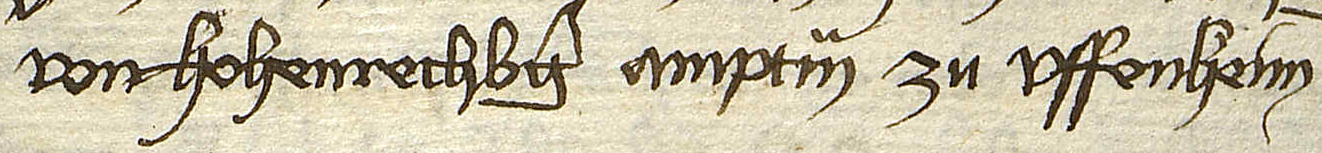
von hohenrechb*g amptm* ʒu Vffenheim
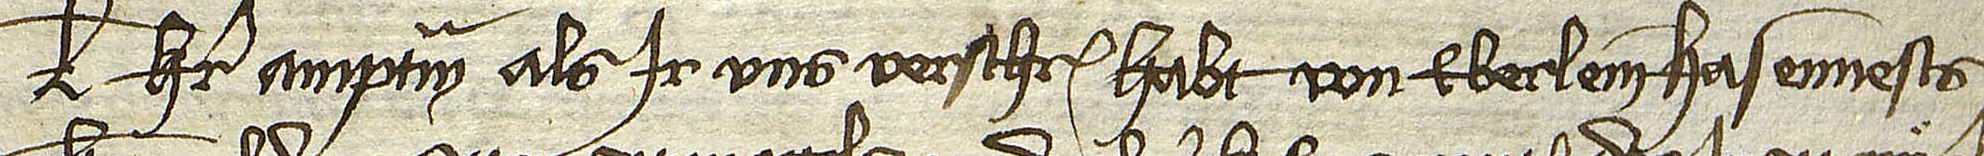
L* hr* amptm* als Ir vns verſchr* habt von Eberlein haſenneſts
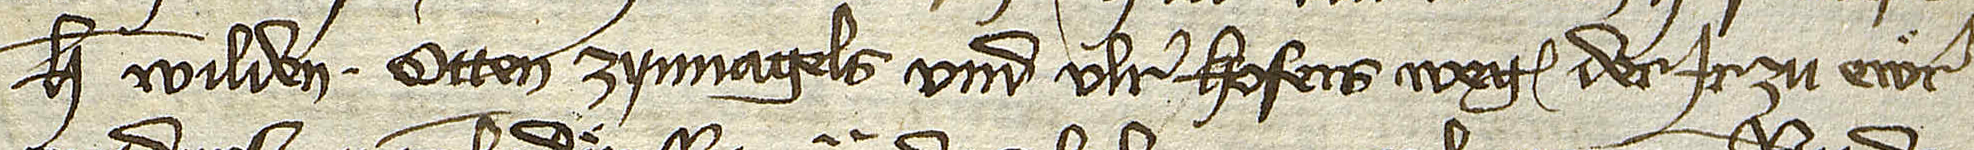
H* wilden . Otten ʒynnagels vnd vlr* hofers weg* der Ir ʒu ewr*
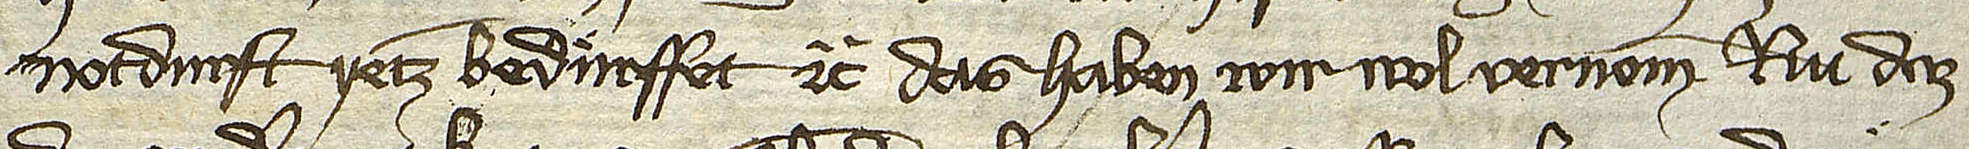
notdurft yecʒ* bedürffet ec* das haben wir wol vernom* . Nu daʒ
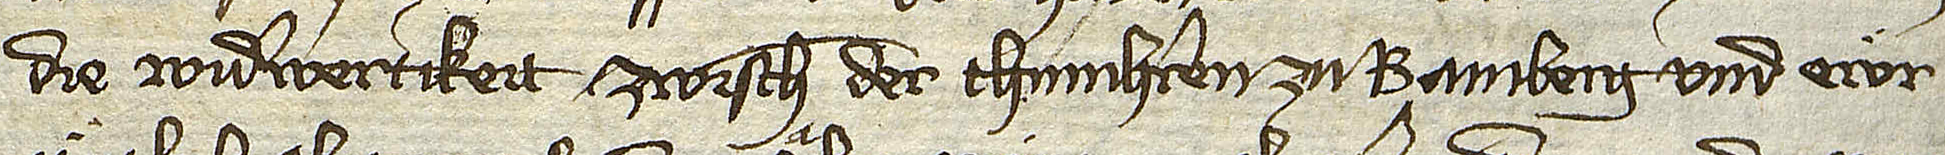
die wid*werikeit ʒwiſch* der thumhr*en ʒu Bamberg vnd ewr
